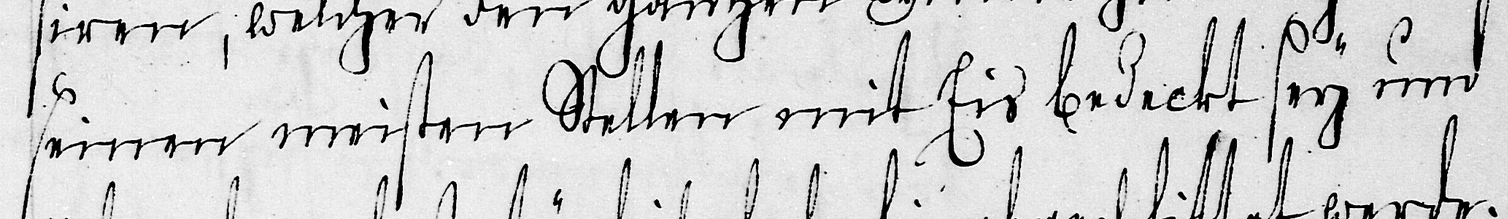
seinen meisten Stellen mit Eis bedeckt sey und
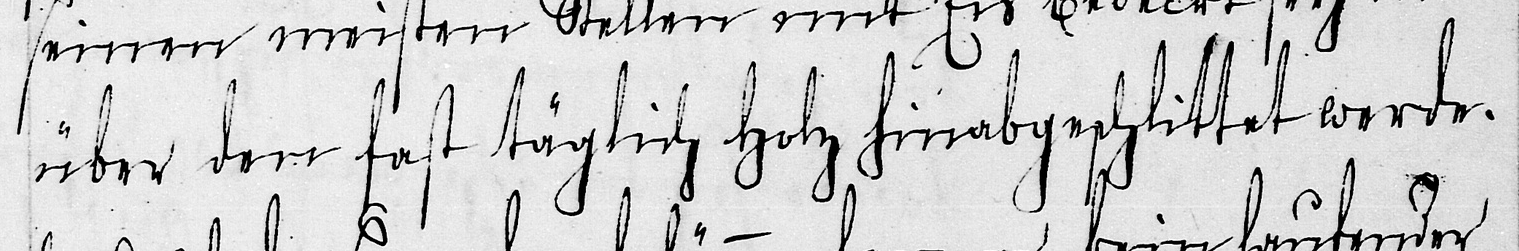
über den fast täglich Holz hinabgeschlittet werde.
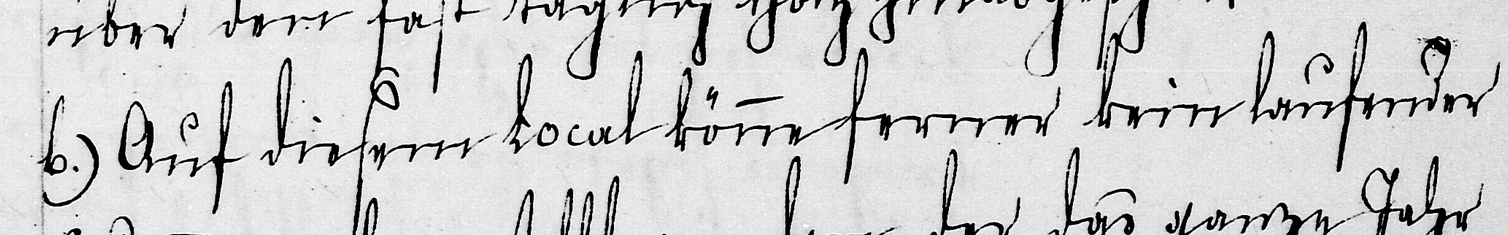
b.) Auf diesem Local könne ferner kein laufender
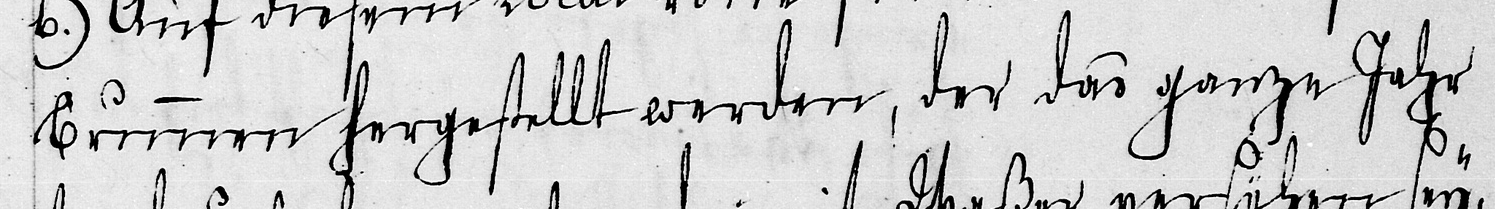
Brunnen hergestellt werden, der das ganze Jahr
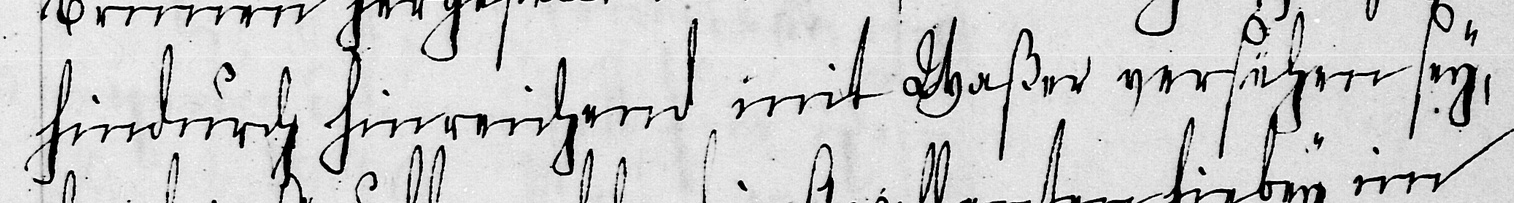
hindurch hinreichend mit Waßer versehen sey,
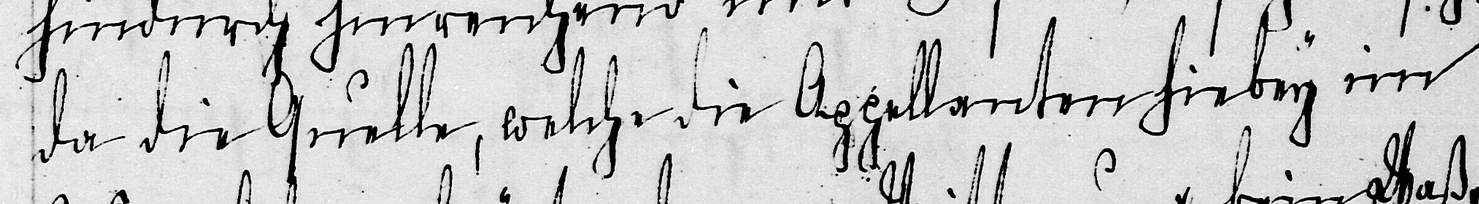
da die Quelle, welche die Appellanten hiebey im
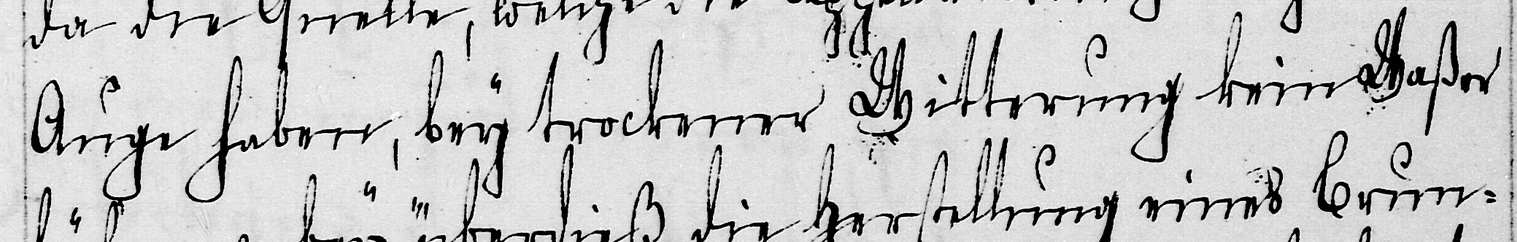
Auge haben, bey trockener Witterung kein Waßer
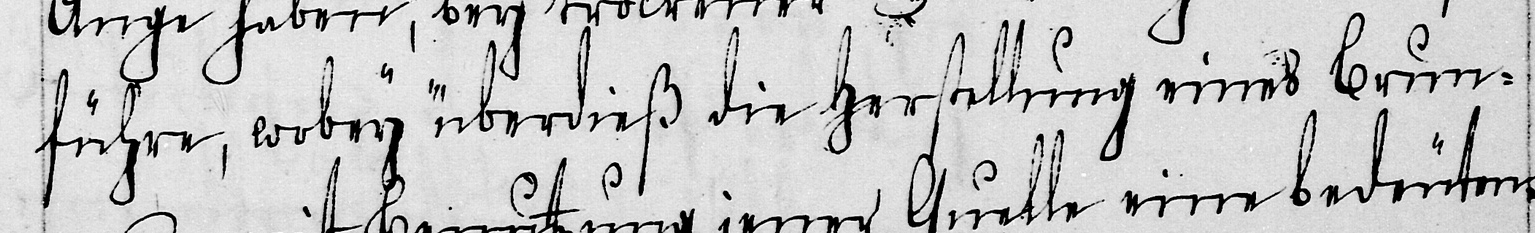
führe, wobey überdieß die Herstellung eines Brun¬
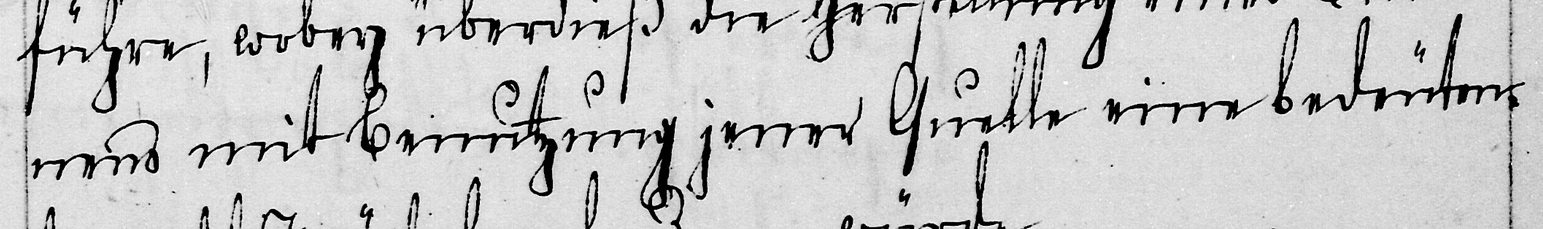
nens mit Benutzung jener Quelle eine bedeuten¬
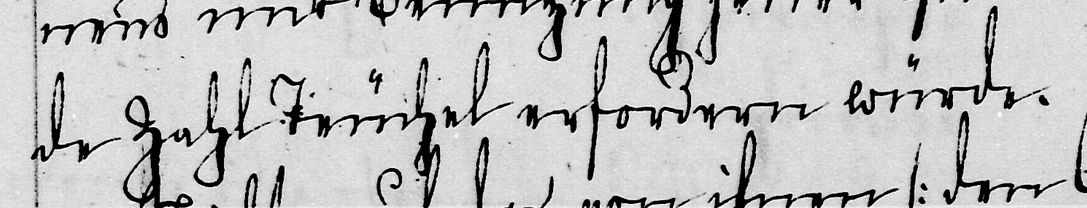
de Zahl Teuchel erfordern würde.
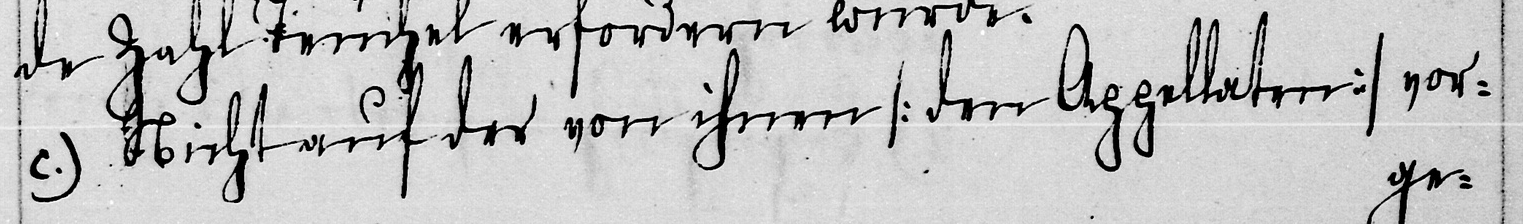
c.) Nicht auf der von ihnen [den Appellaten] vor-
